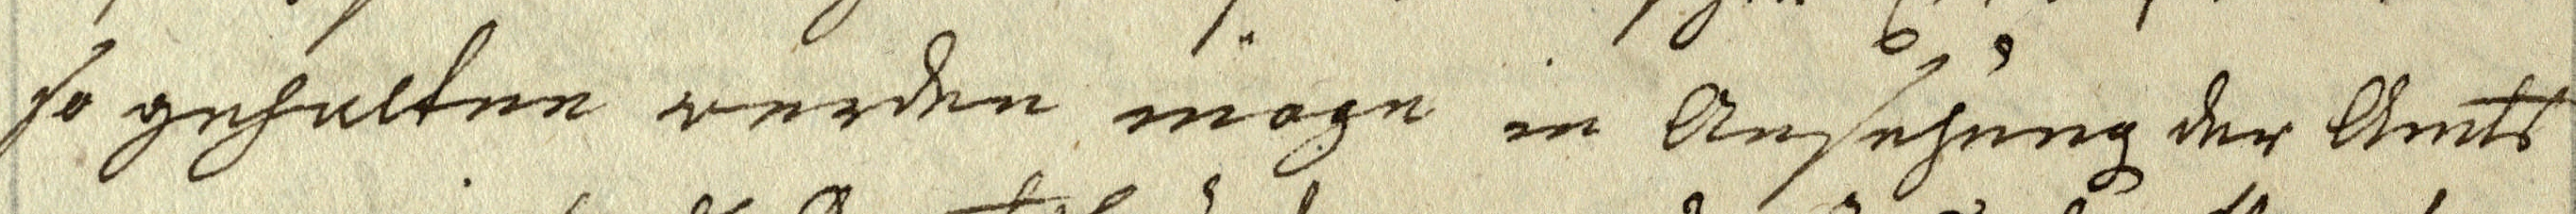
so gehalten werden möge in Ansehung der Amts¬
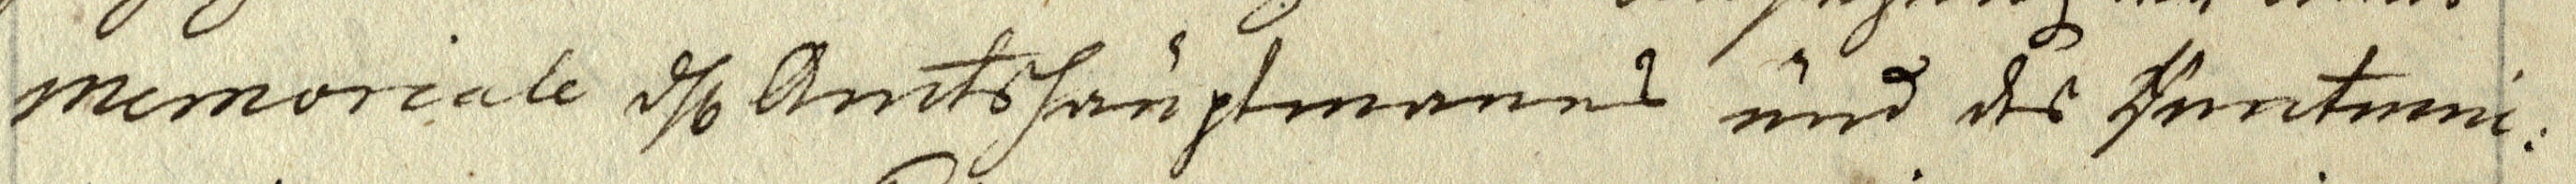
memoriale dh Amtshauptmanns und des Rentmei¬
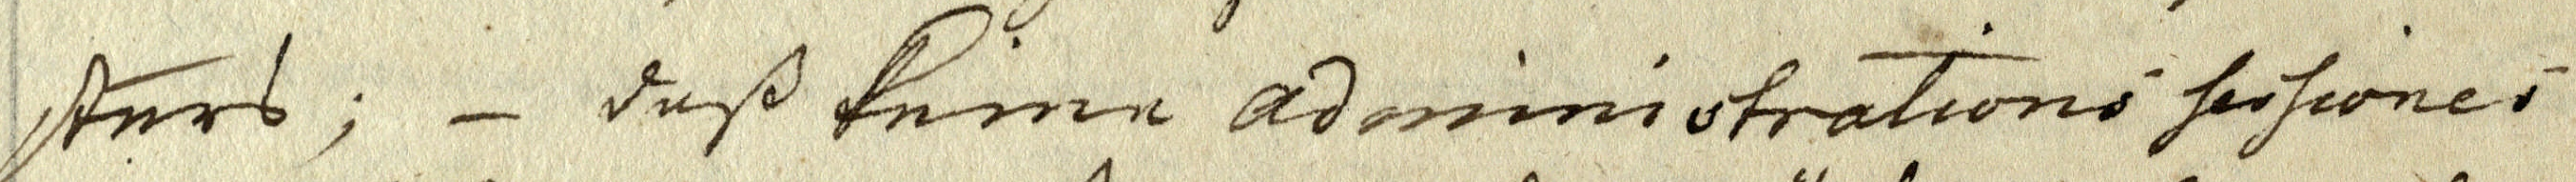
sters; daß keine Administrations sessiones
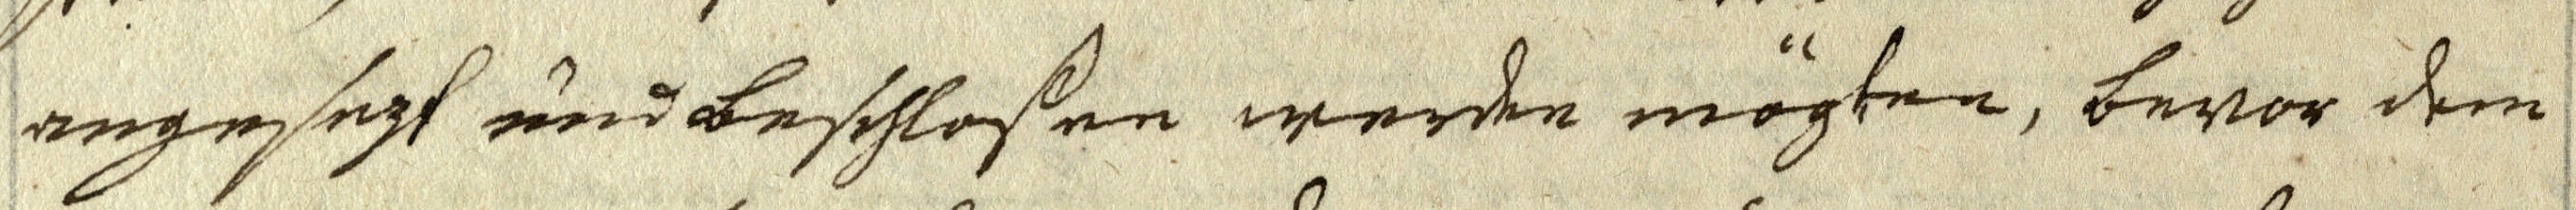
angesagt und beschloßen werden mögten, bevor dem
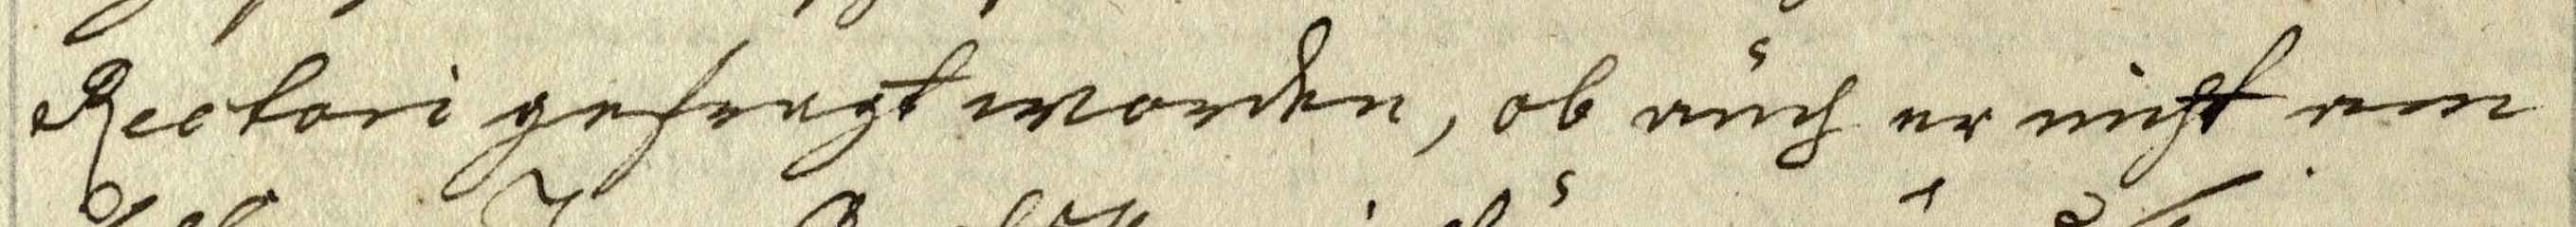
Rectori gefragt worden, ob auch er nicht am
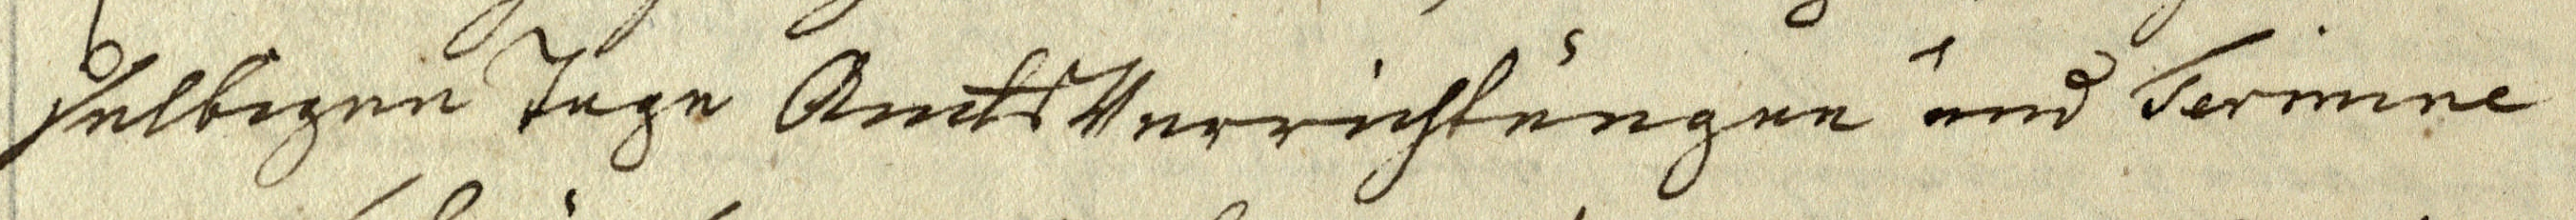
selbigen Tage Amtsverrichtungen und Termine
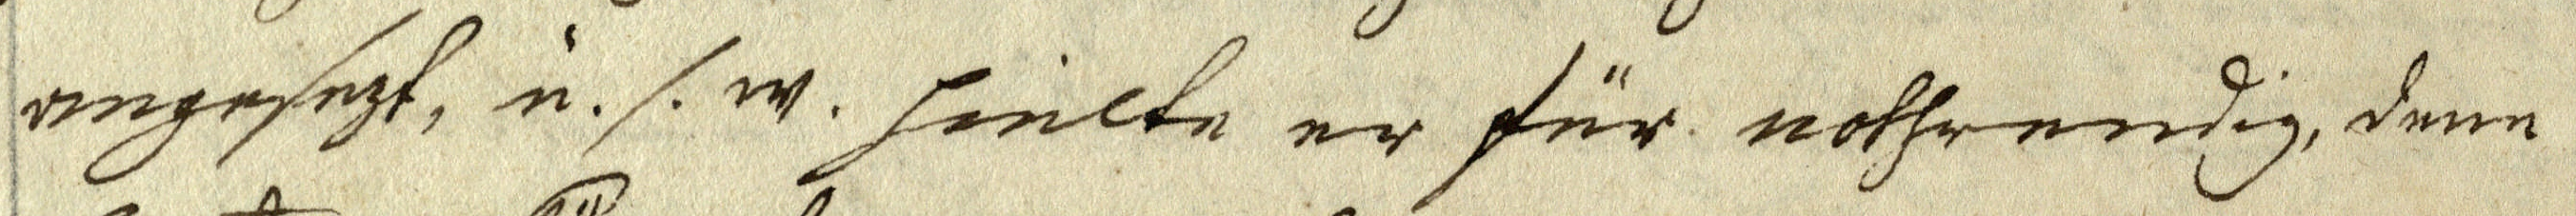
angesezt, u. s. w. hielte er für nothwendig, denn
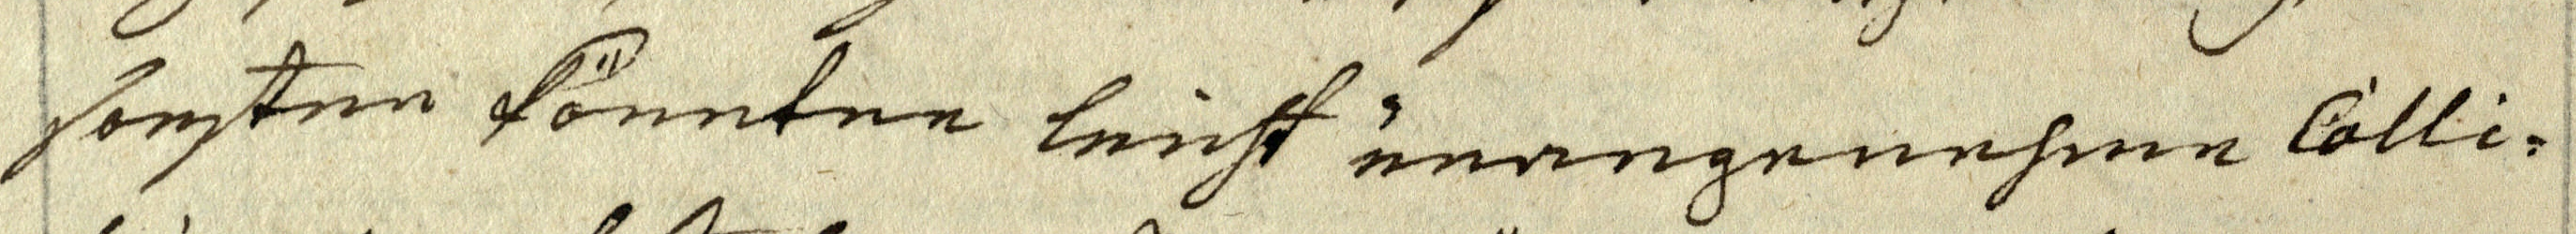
sonsten könnten leicht unangenehme Colli¬
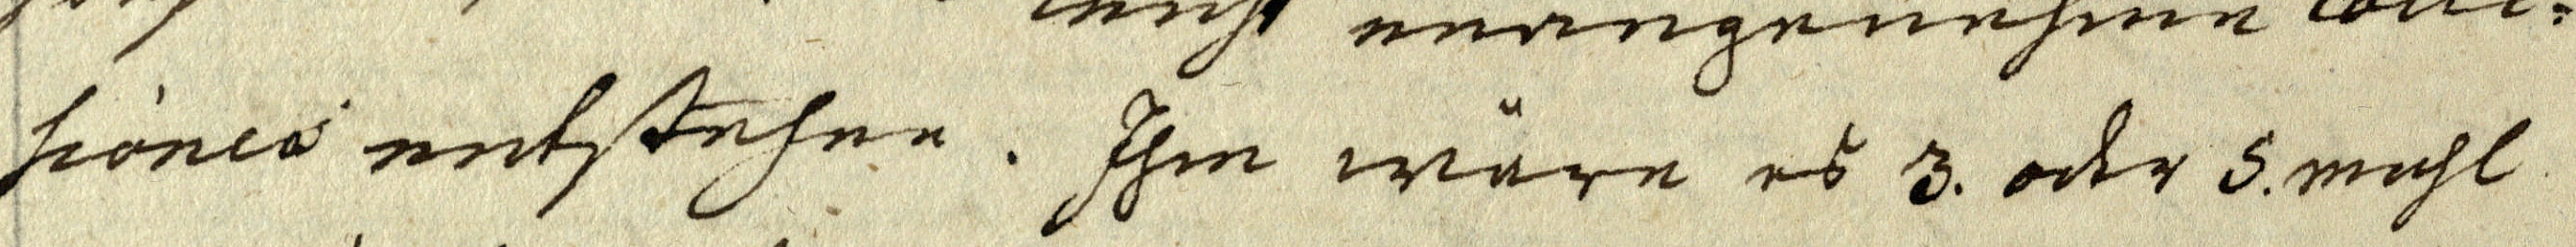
siones entstehen. Ihm wäre es 3. oder 5. mahl
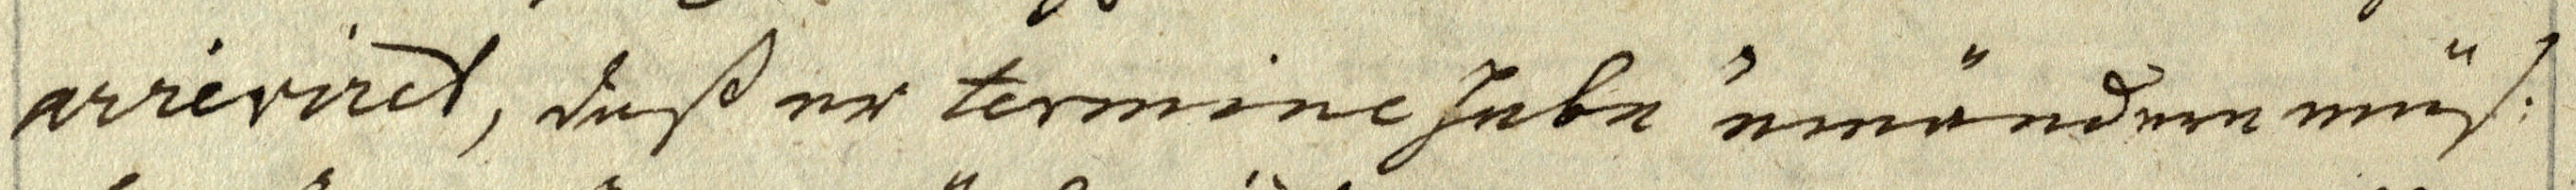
arriviret, daß er termine habe umändern müs¬
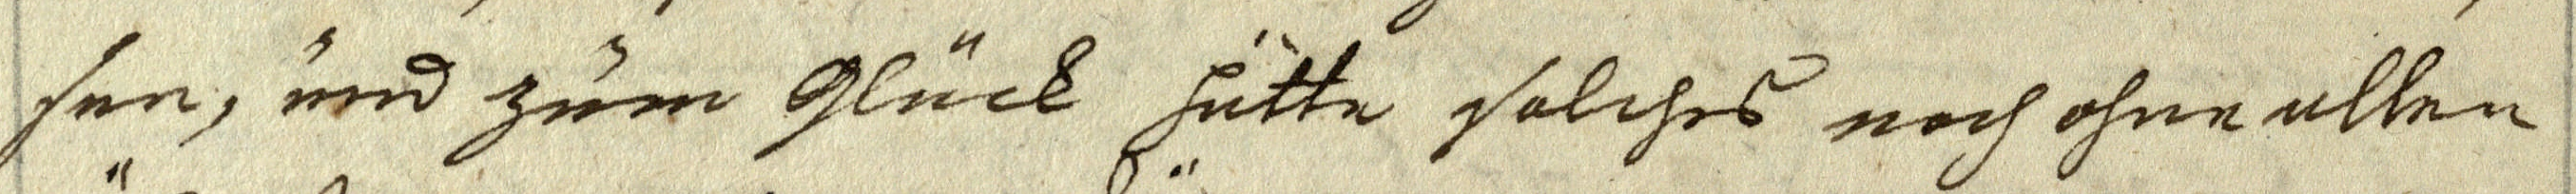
sen, und zum Glück hätte solches noch ohne allen
